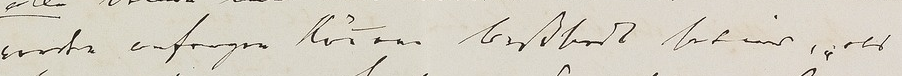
werden anfragen können. Boßhardt hat mir «als
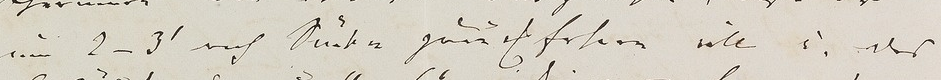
um 2–3' nach Süden zurückfahren will u. das
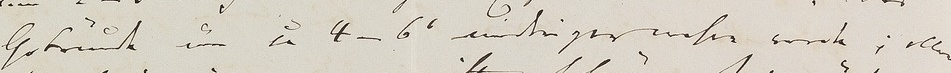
Gebäude nun um 4–6' niedriger machen werde; allein
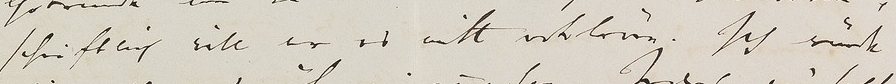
schriftlich will er es nicht erklären. Ich würde
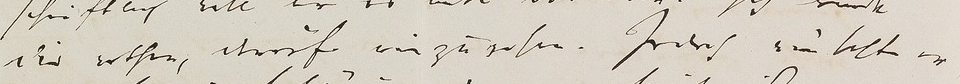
dir rathen, darauf einzugehen. Jedoch wünscht er
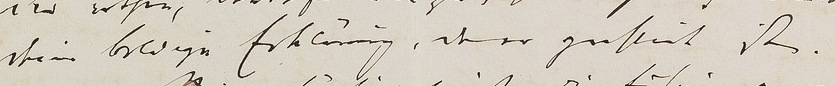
deine baldige Erklärung, da er pressirt ist.
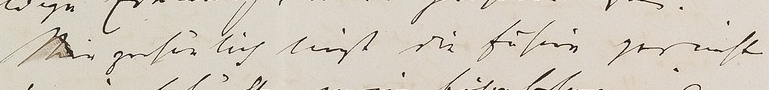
Mir persönlich liegt die Fusion gar nicht
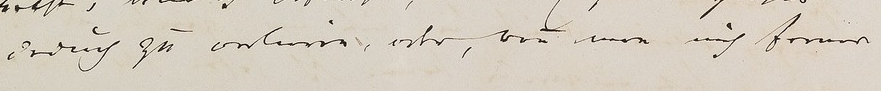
dadurch zu verlieren, oder, wenn man mich ferner
